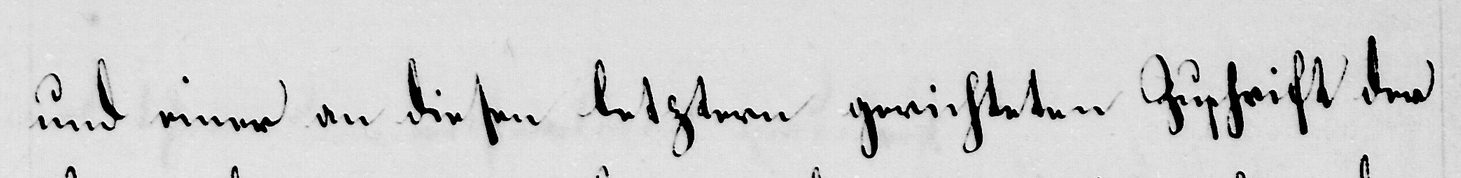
und einer an diesen letztern gerichteten Zuschrift der
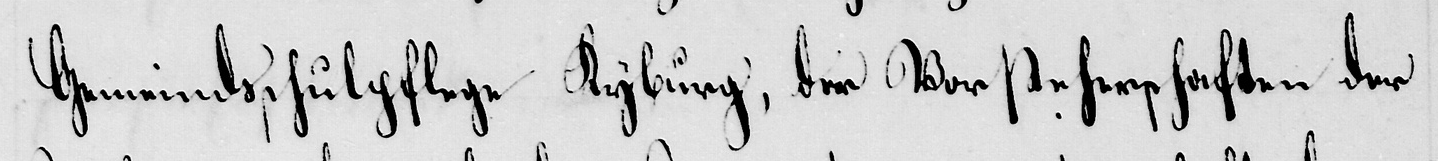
Gemeindsschulpflege Kyburg, der Vorsteherschaften der
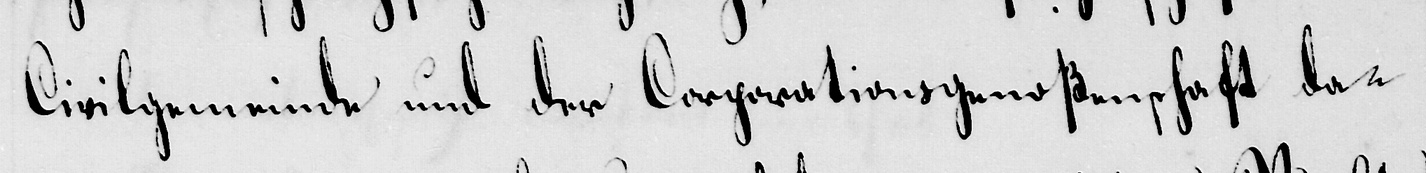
Civilgemeinde und der Corporationsgenoßenschaft das¬
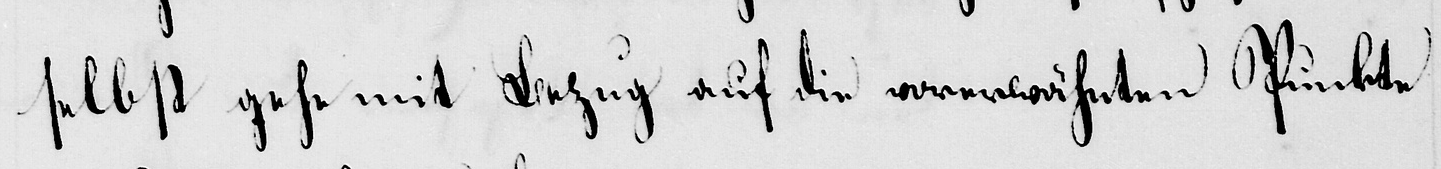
elbst gehe mit Bezug auf die vorerwähnten Punkte
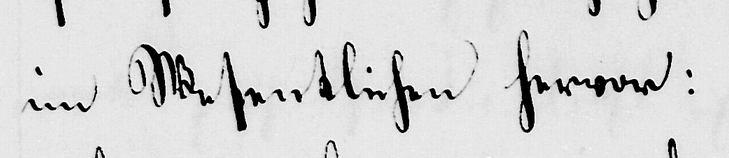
im Wesentlichen hervor:
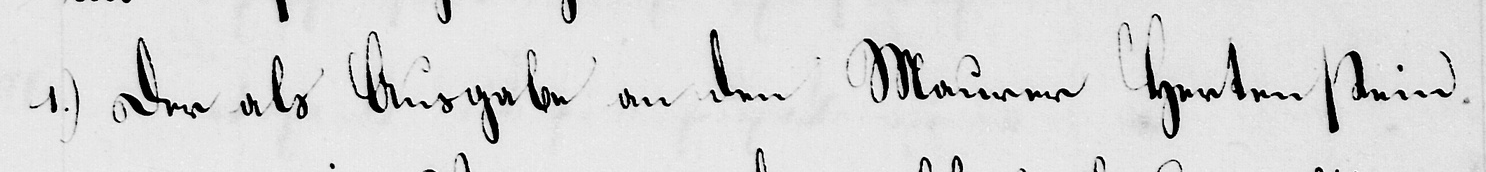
1.) Der als Ausgabe an den Maurer Hertenstein
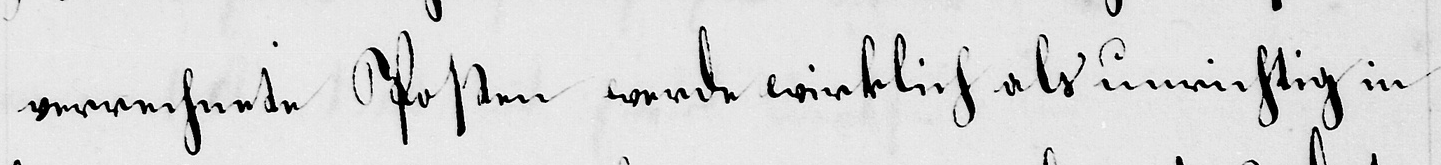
verrechnete Posten werde wirklich als unrichtig in
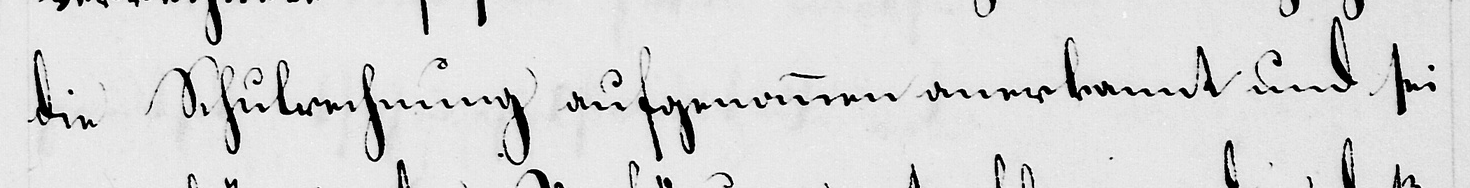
die Schulrechnung aufgenommen anerkannt und sei
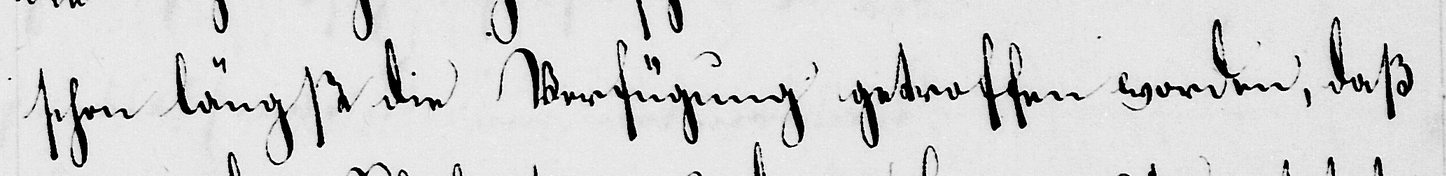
schon längst die Verfügung getroffen worden, daß
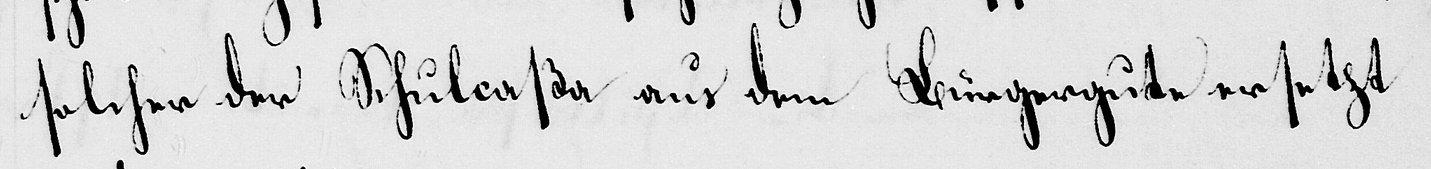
solcher der Schulcaßa aus dem Bürgergute ersetzt
